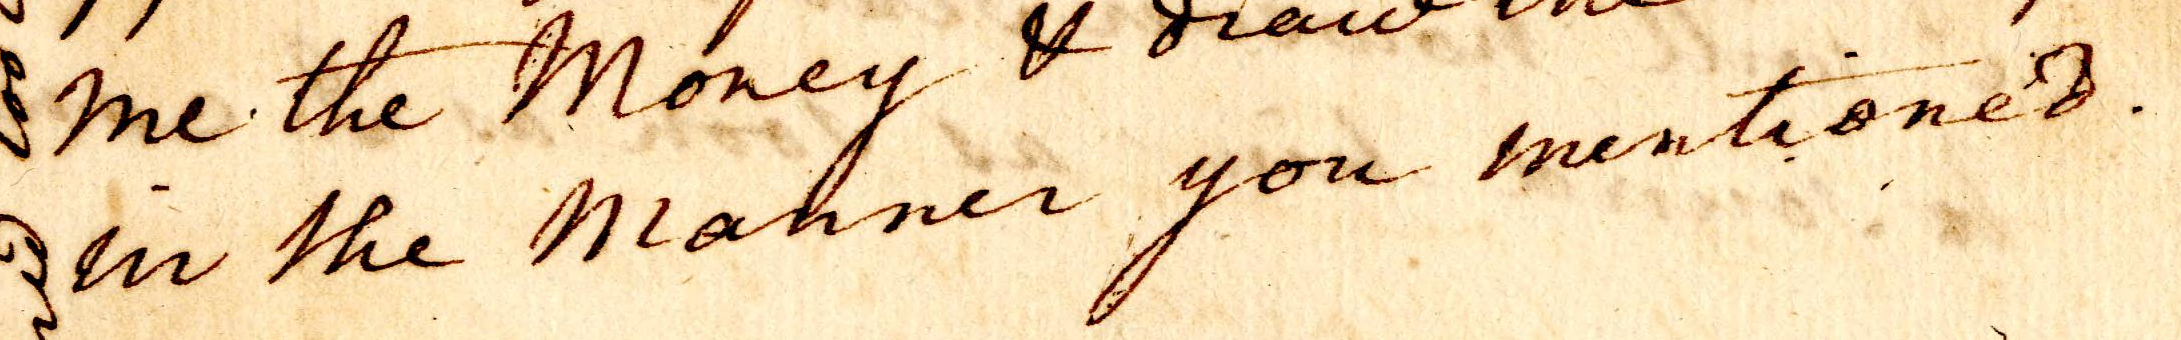in the Manner you mentioned.
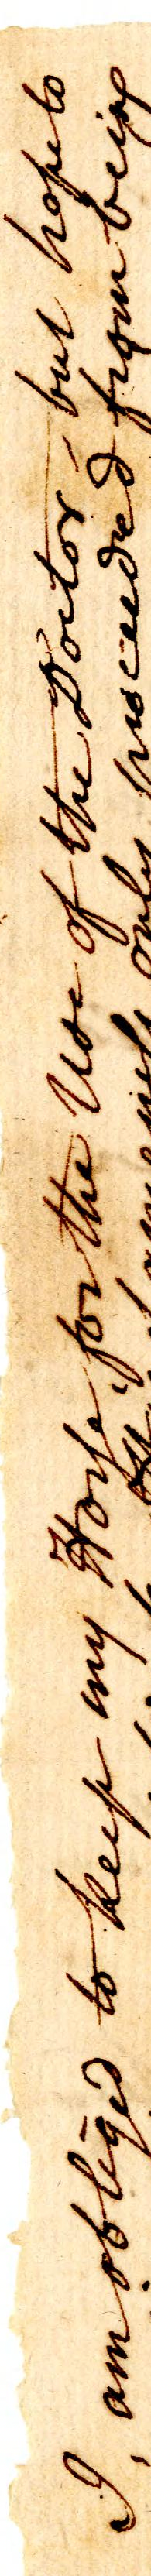I, am obliged to keep my Horse for the Use of the Doctor, but hope to
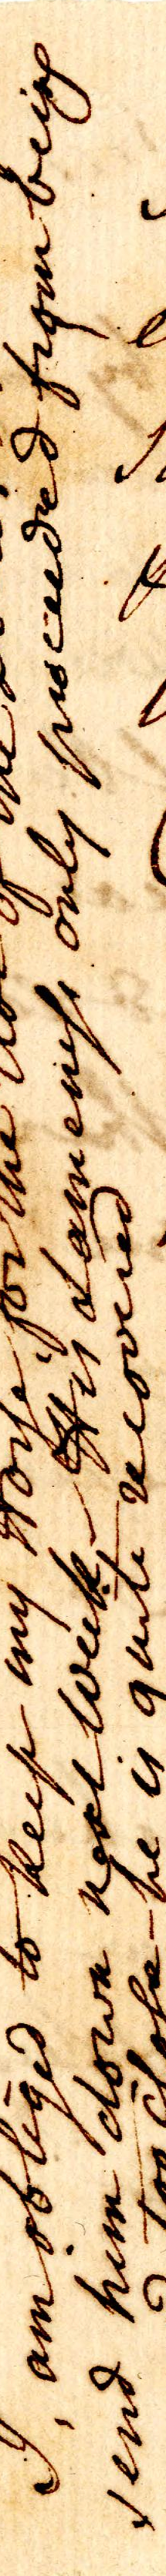send him down next week- His Lameness only proceeded from being
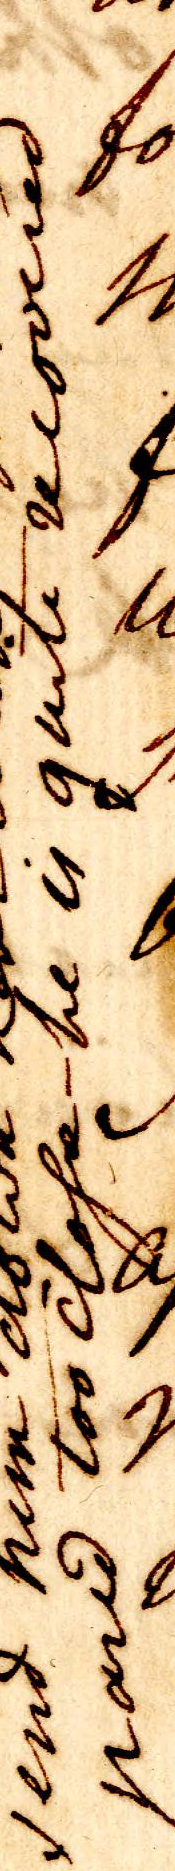pared too close- he is quite recovered
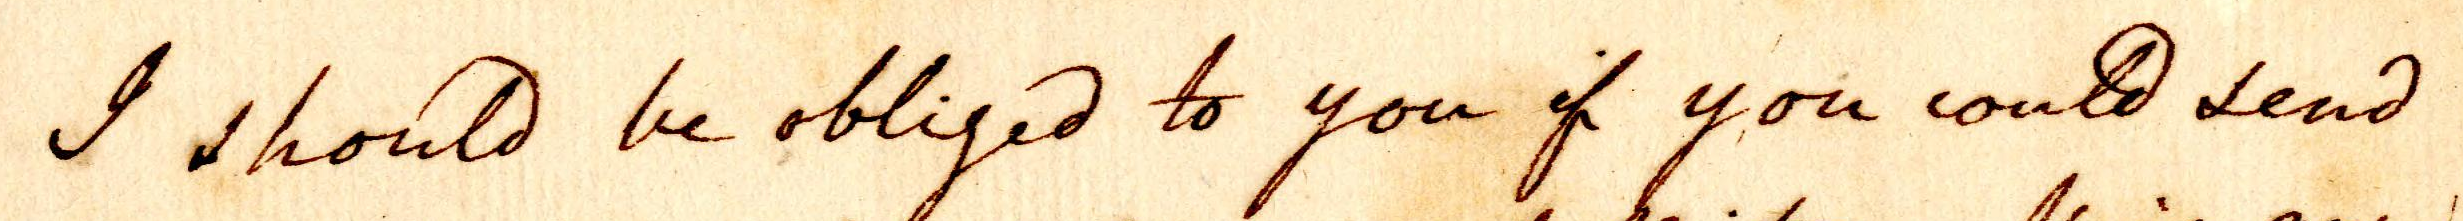I should be obliged to you if you could send
